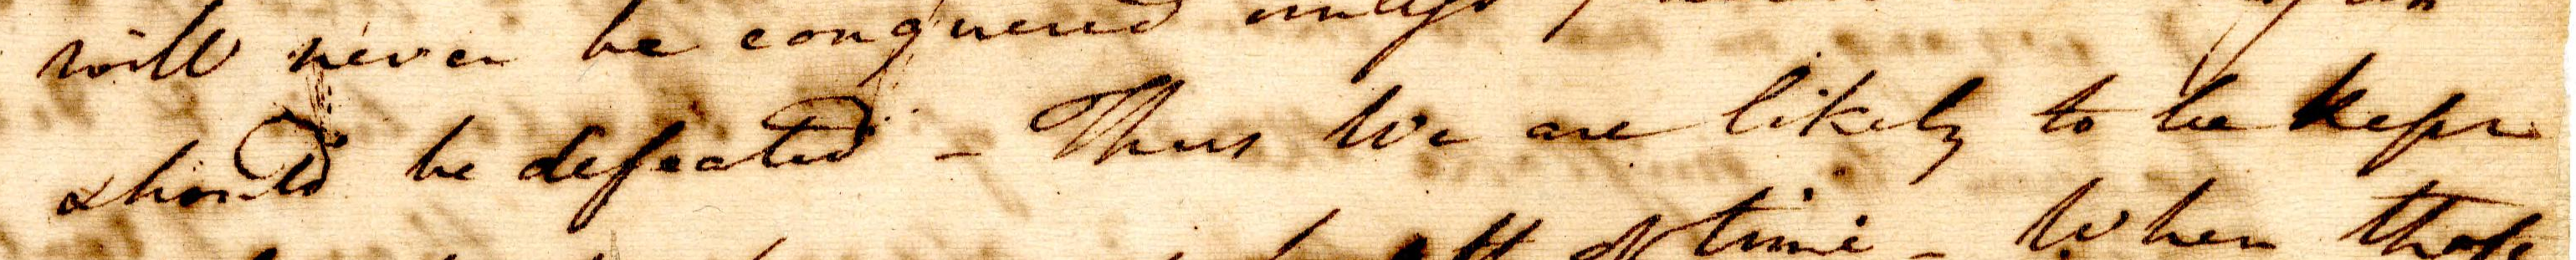should be defeated- Thus We are likely to be kept
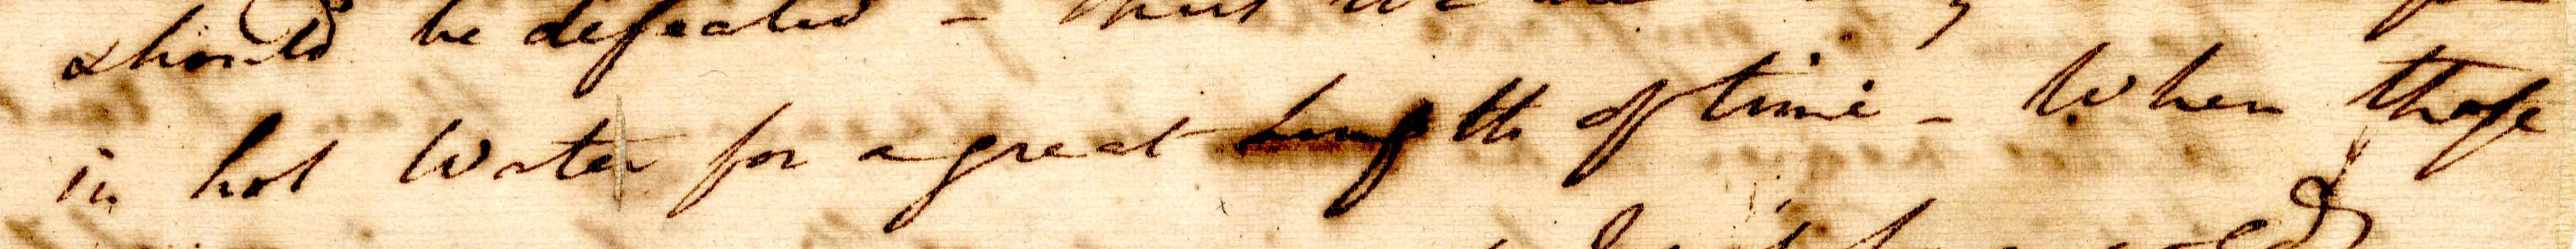in hot Water for a great Length of time- When those
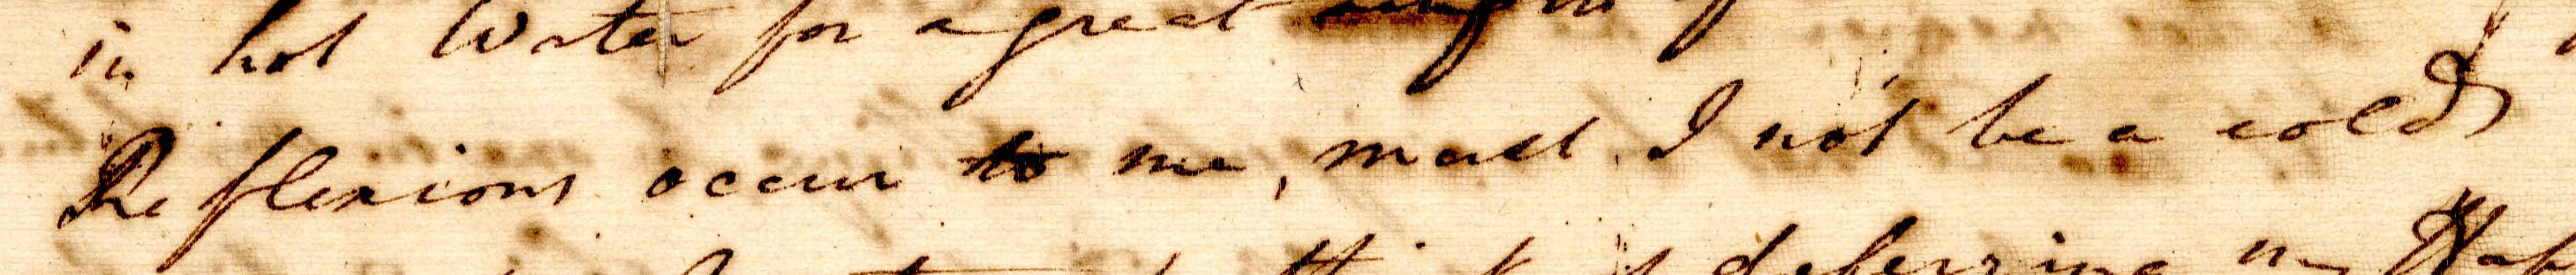Reflexions occur to me, must I not be a cold
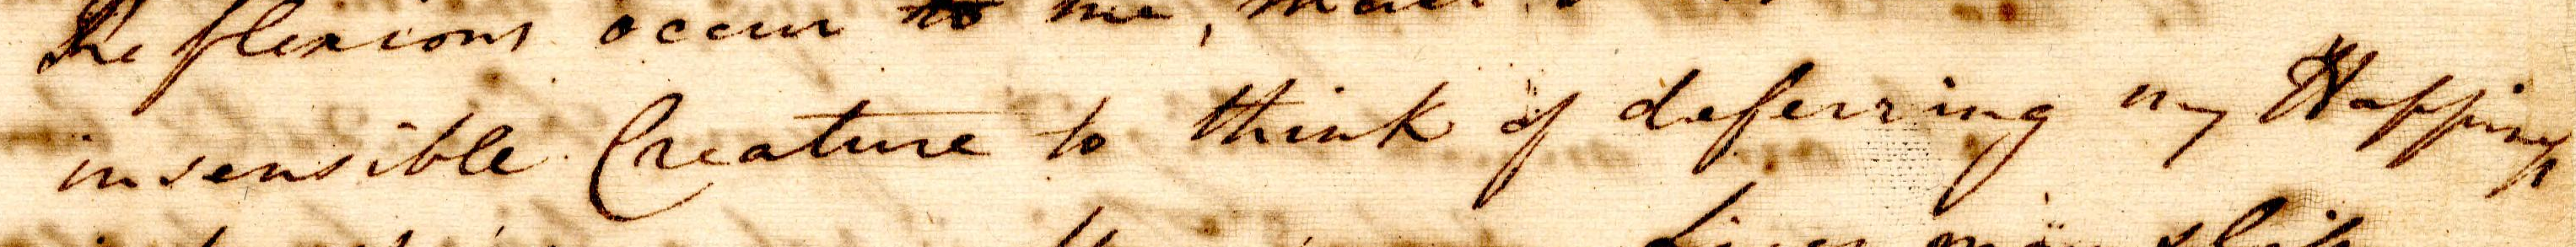insensible Creature to think of deferring my Happiness
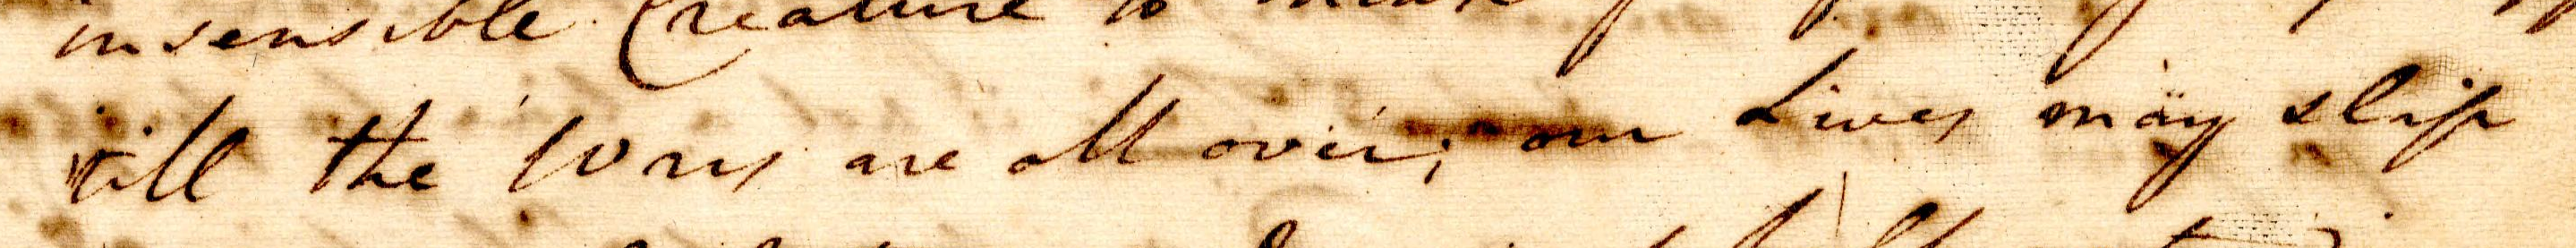till the Wars are all over; our Lives may slip
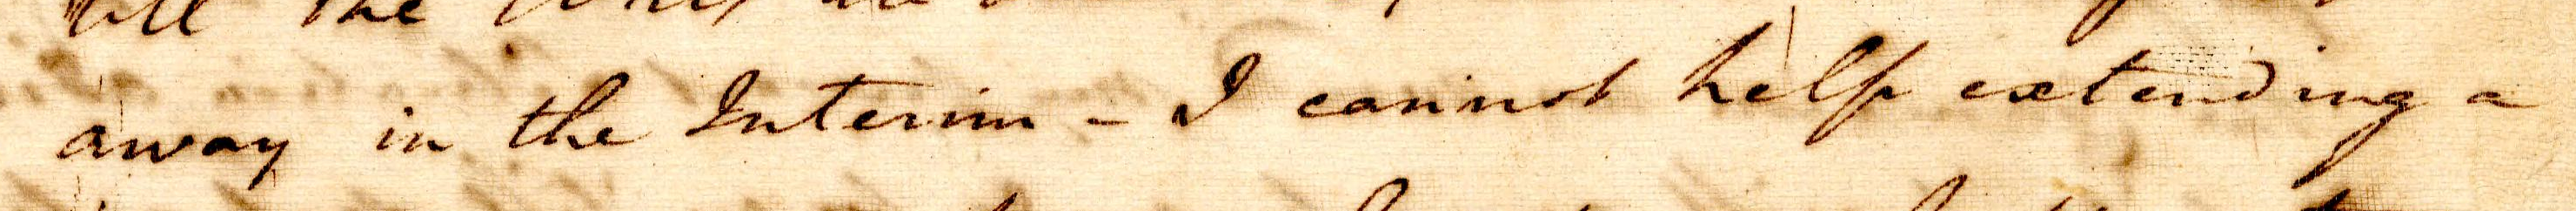away in the Interim- I cannot help extending a
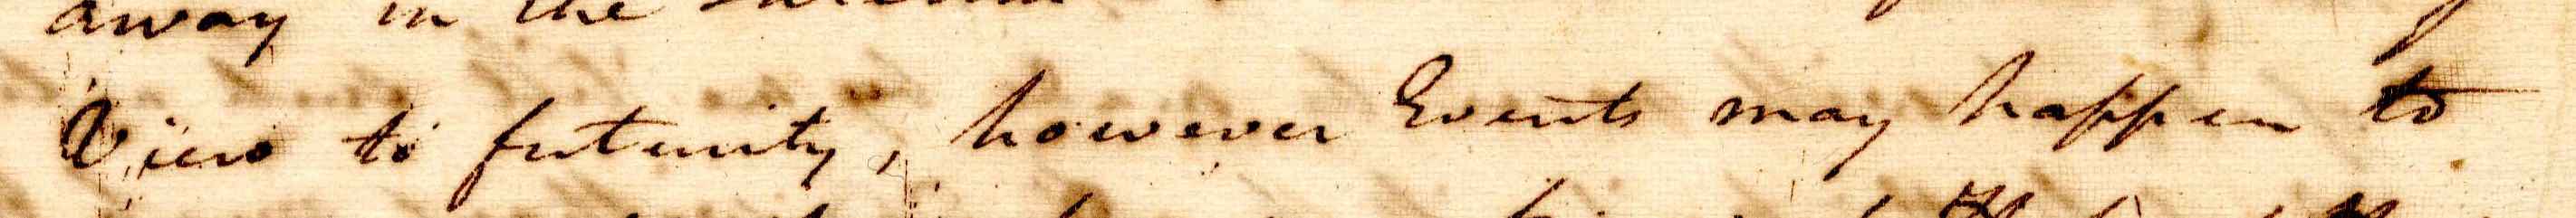View to futurity, however Events may happen to
